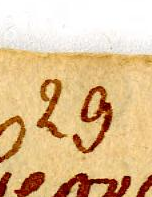29
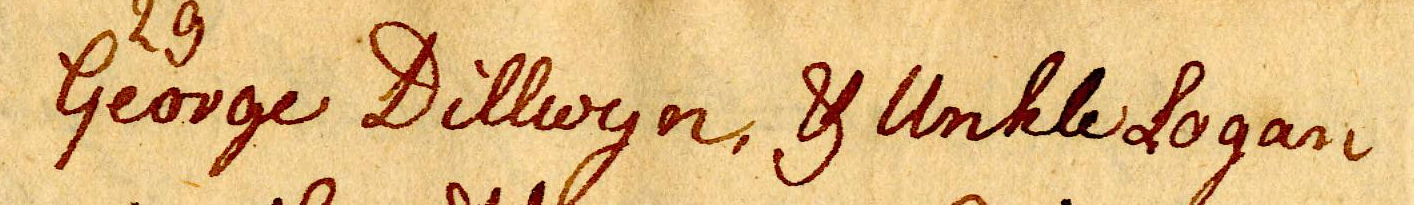George Dillwyn, & Unkle Logan
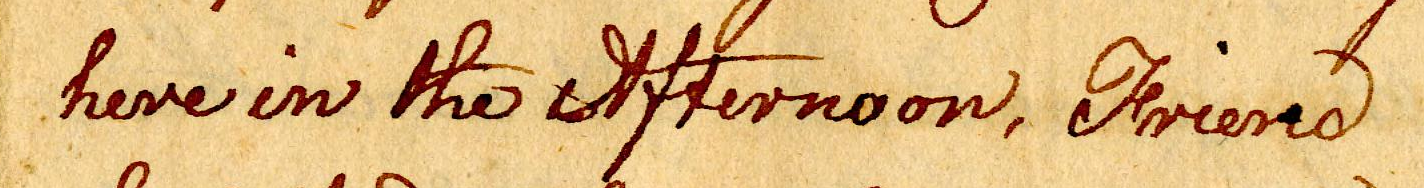here in the Afternoon, Friend
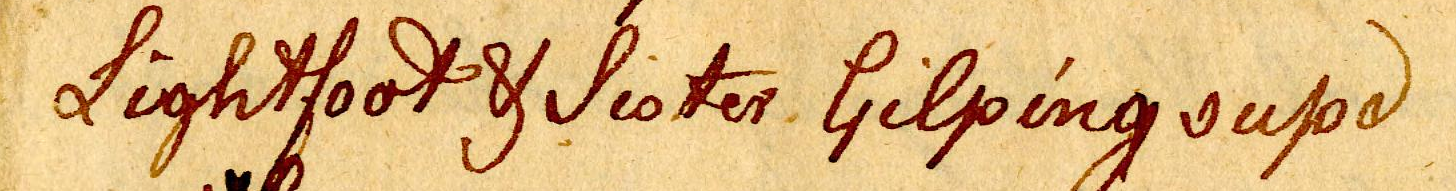Lightfoot & Sister Gilping supd
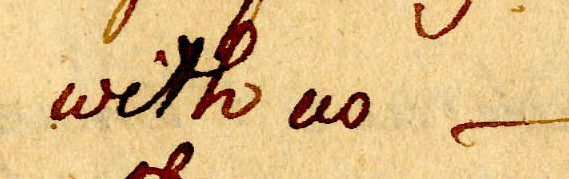with us-
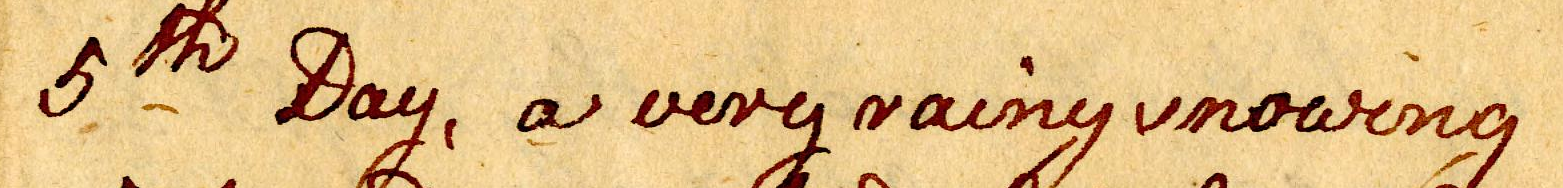5^th Day, a very rainy snowing
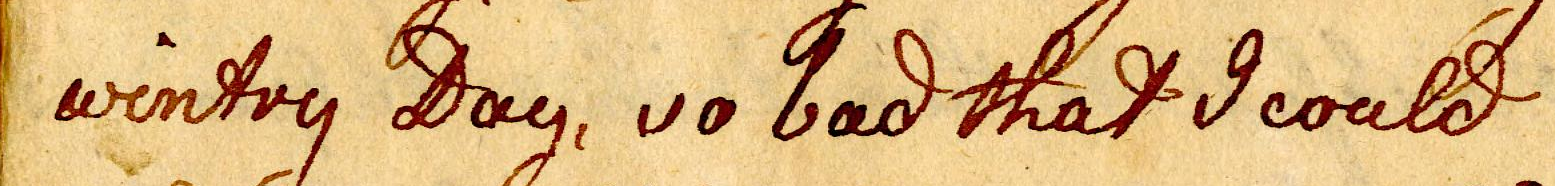wintry Day, so bad that I could
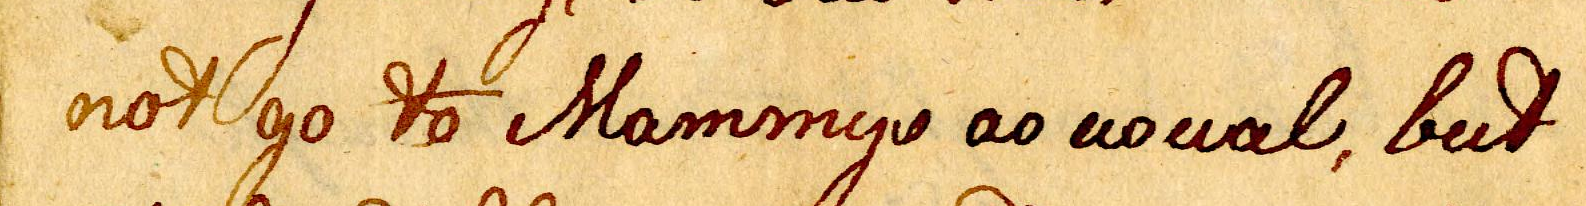not go to Mammys as usual, but
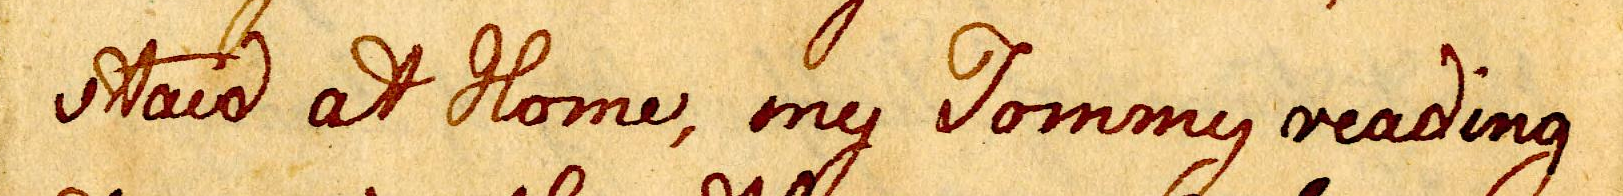staid at Home, my Tommy reading
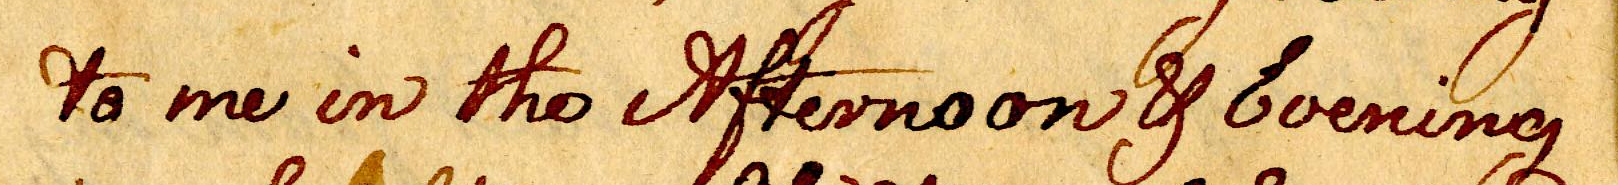to me in the Afternoon & Evening
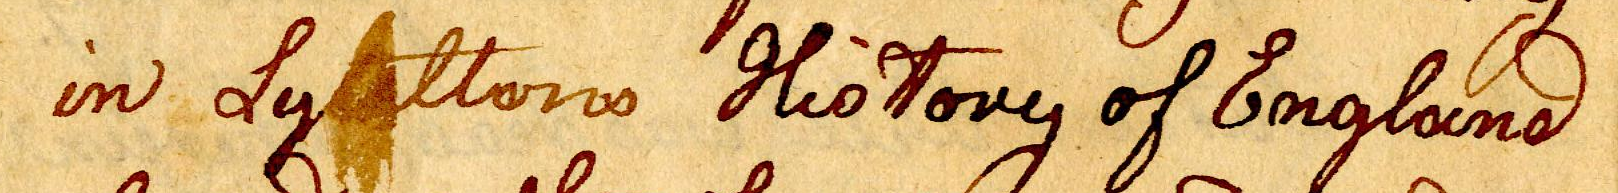in Ly[_]ttons History of England
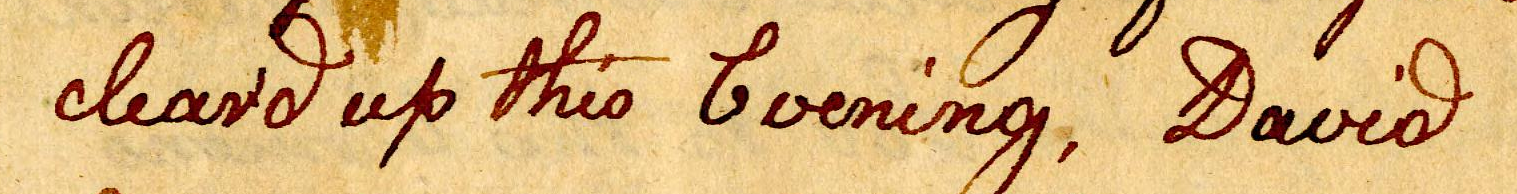clear'd up this Evening, David
